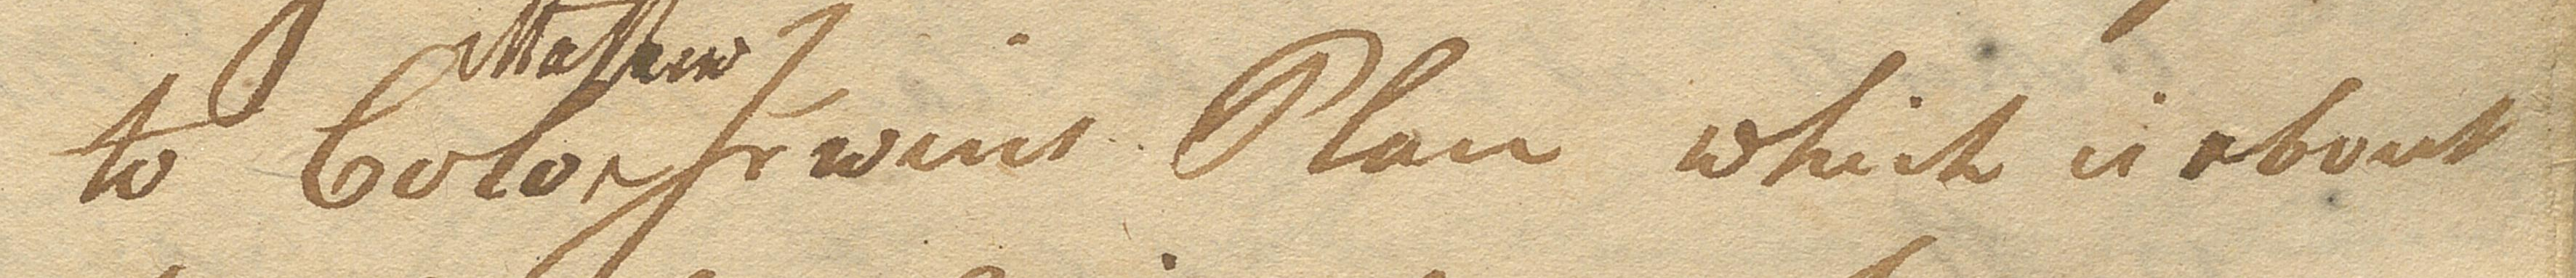to Colo ^ Irwins Plan which is about
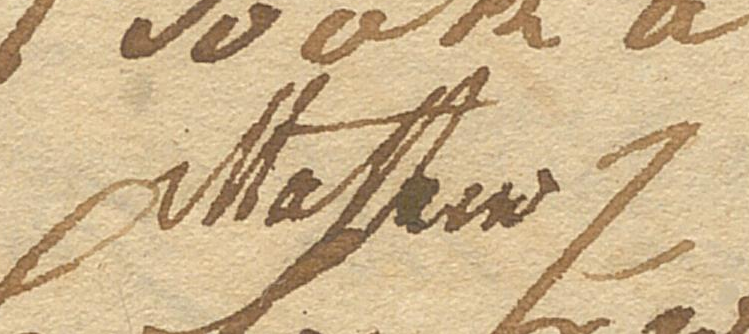Mathew
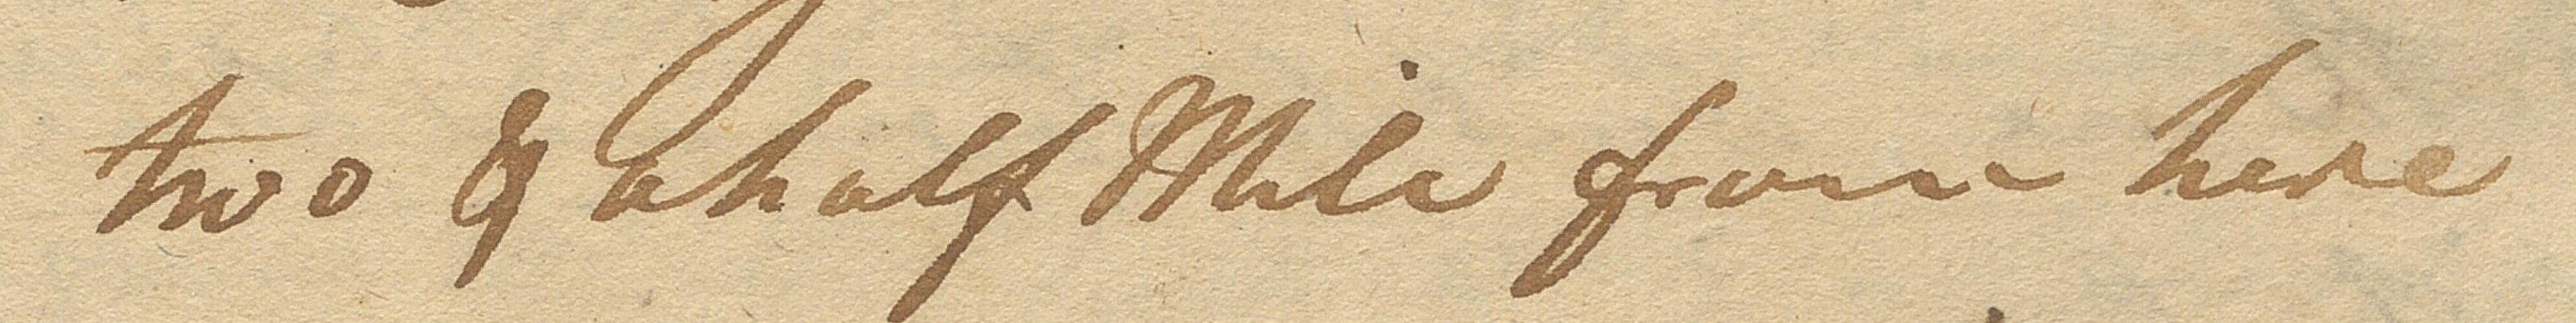two & a half Mile from here
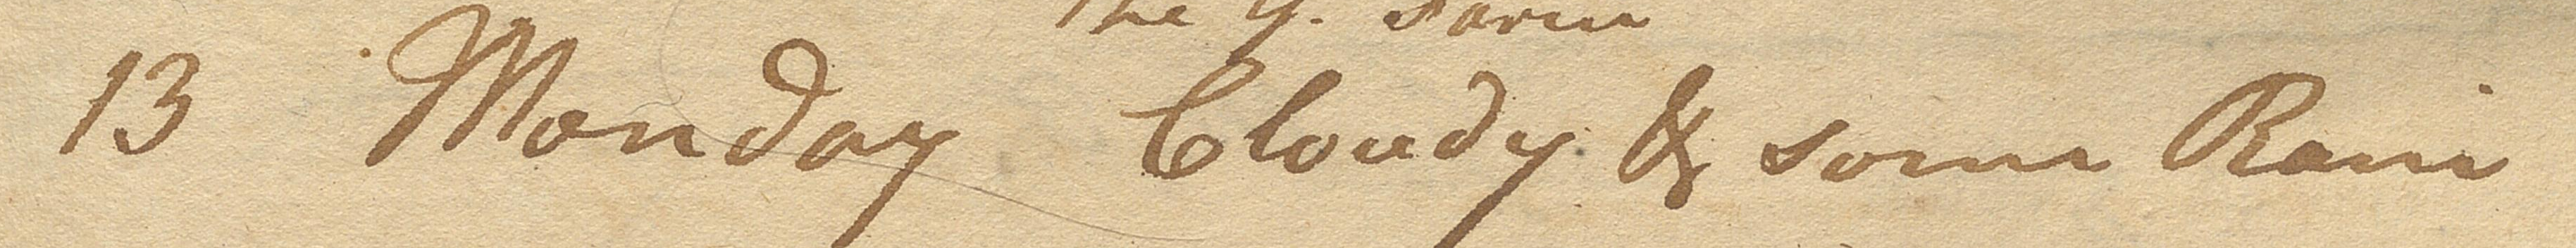13 Monday Cloudy & some Rain
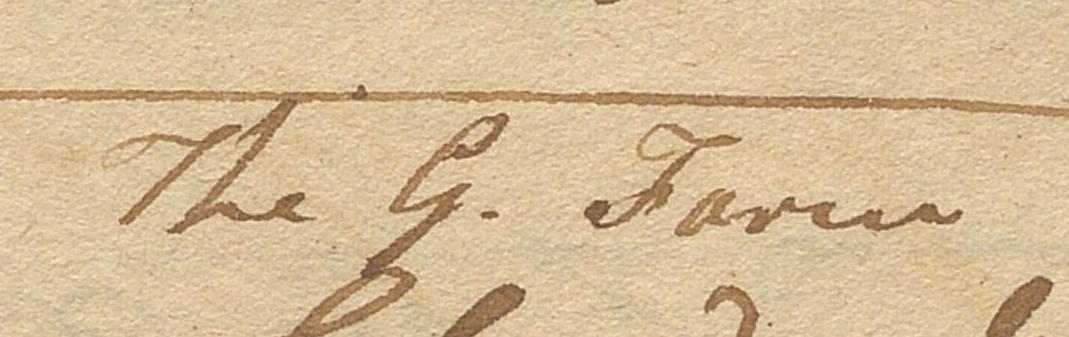The G. Farm
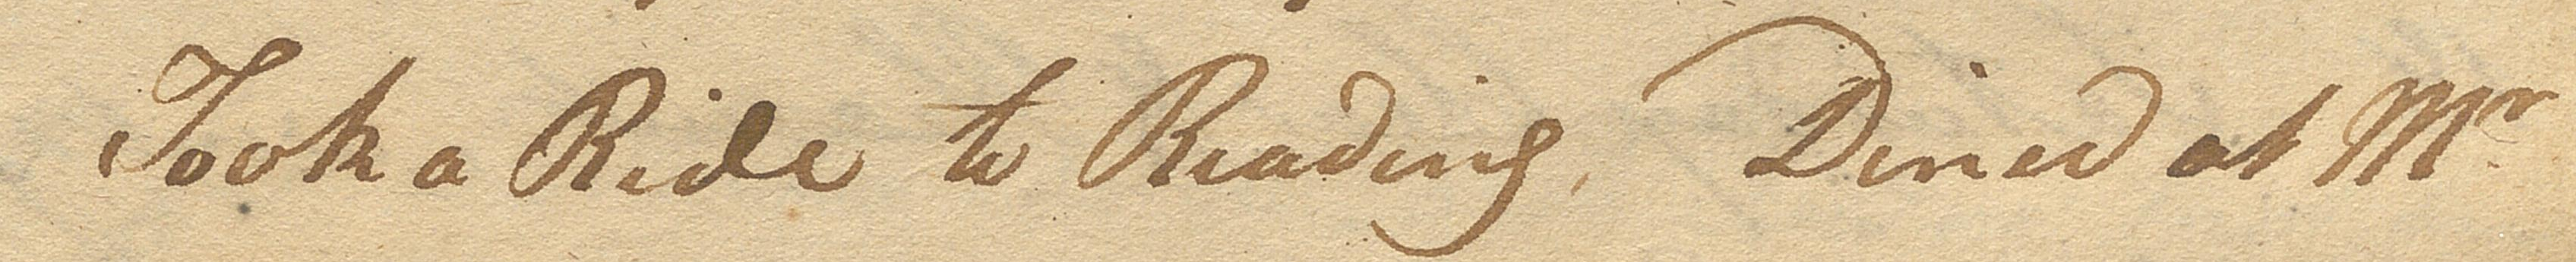Took a Ride to Reading. Dined at M^r.
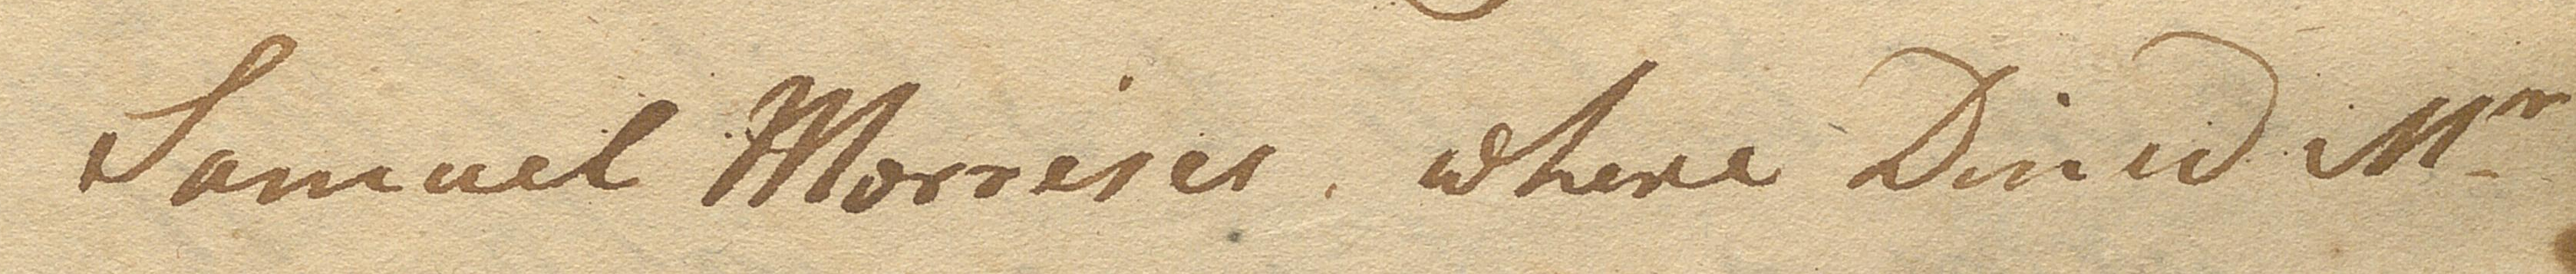Samuel Morrises. where Dined M^r
